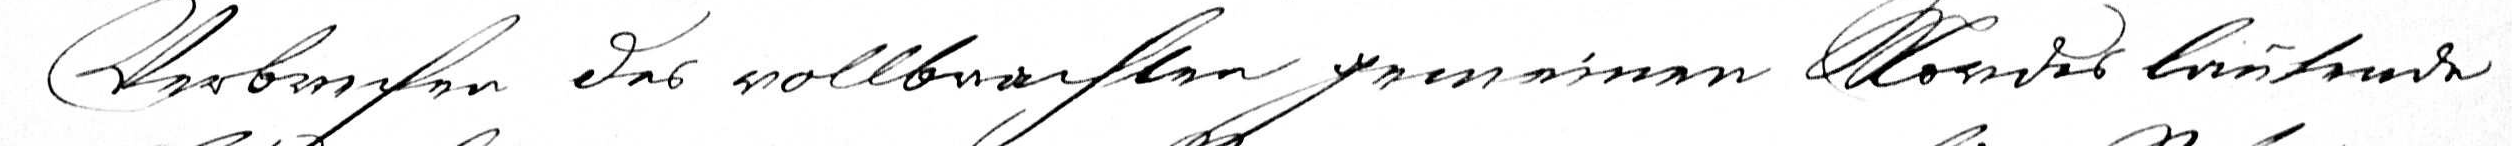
Verbrechen das vollbrachten gemeinen Mordes lautende
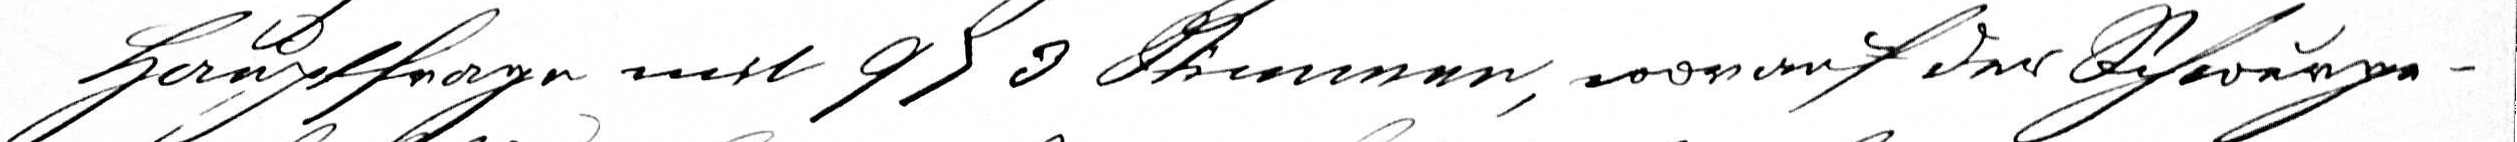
Hauptfrage mit 9>3 Stimmen, worauf der Schwurge¬
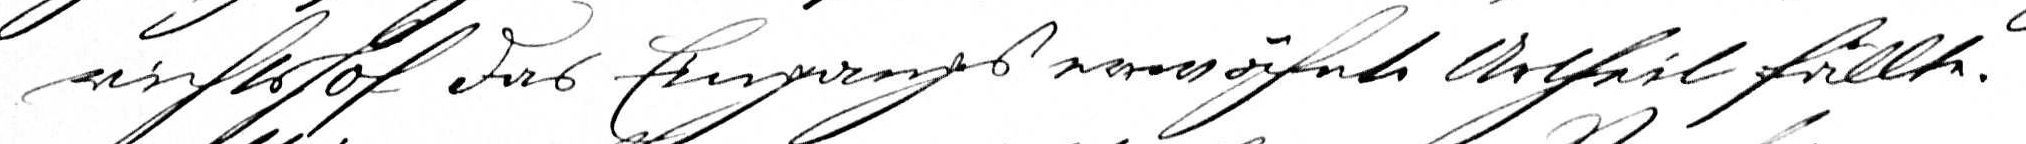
richtshof das Eingangs erwähnte Urtheil fällte.
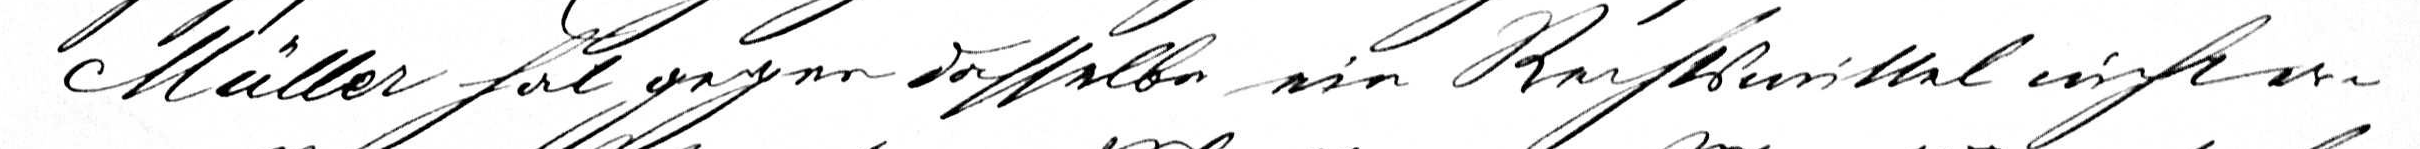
Müller hat gegen dasselbe ein Rechtsmittel nicht er¬
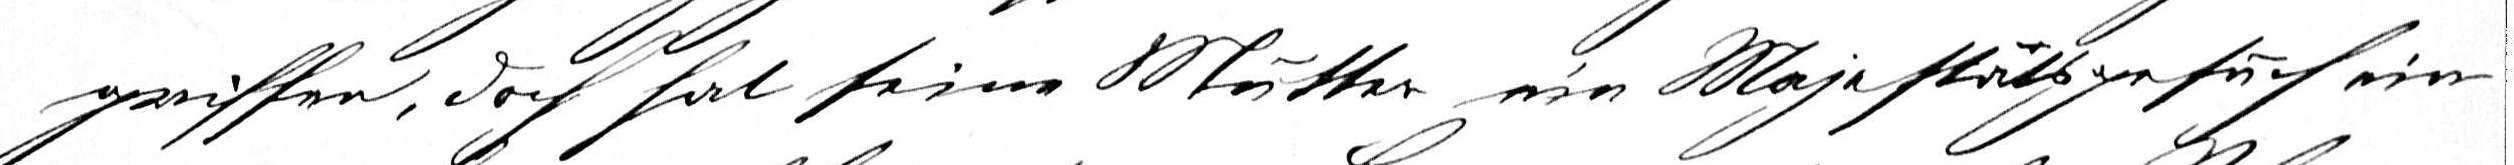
griffen, doch hat seine Mutter ein Majestätsgesuch ein¬
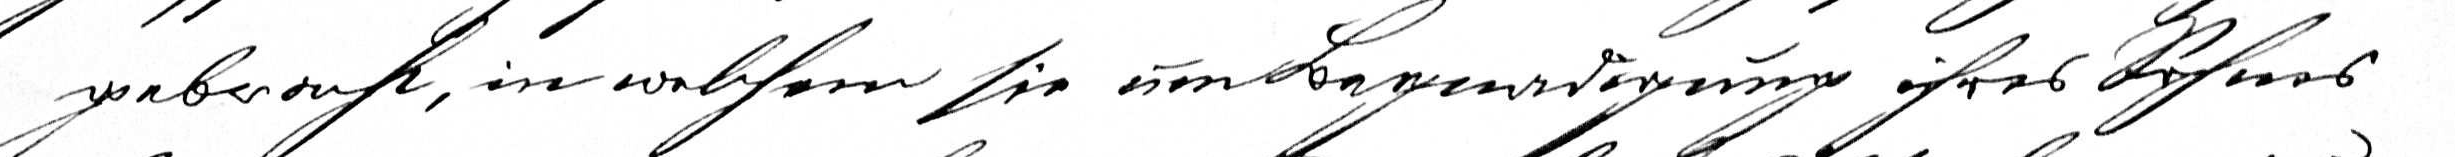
gebracht, in welchem sie um Begnadigung ihres Sohnes
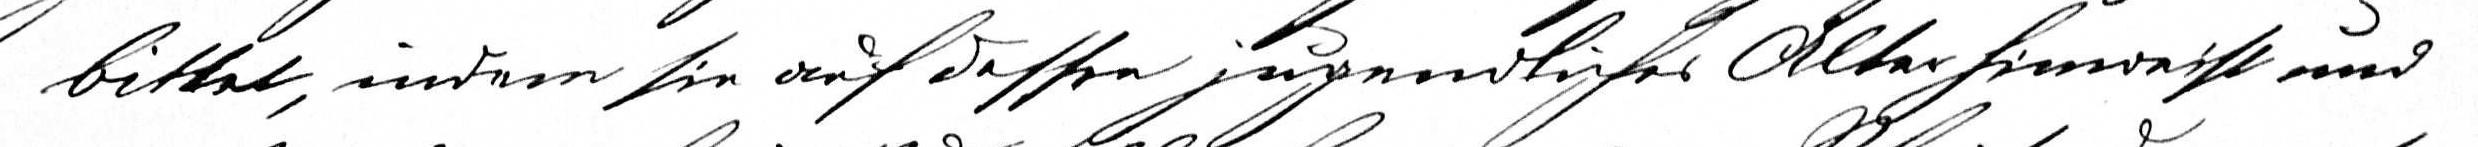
bittet, indem sie auf dessen jugendliches Alter hinweist und
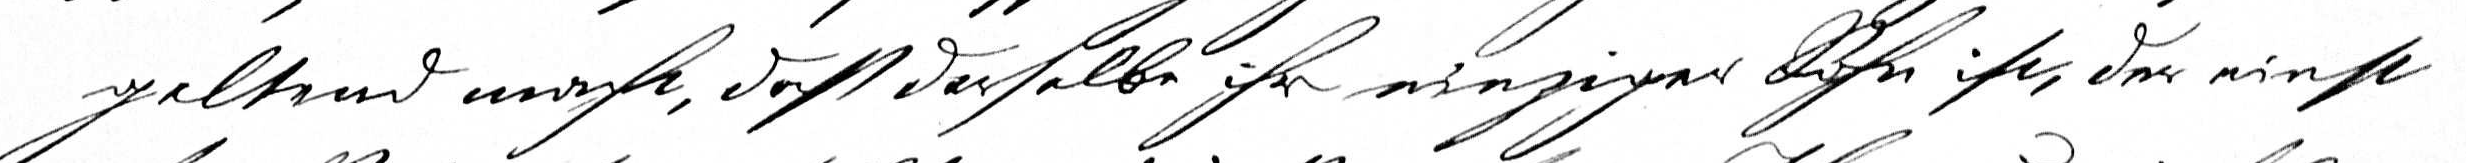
geltend macht, daß derselbe ihr einziger Sohn ist, der einst
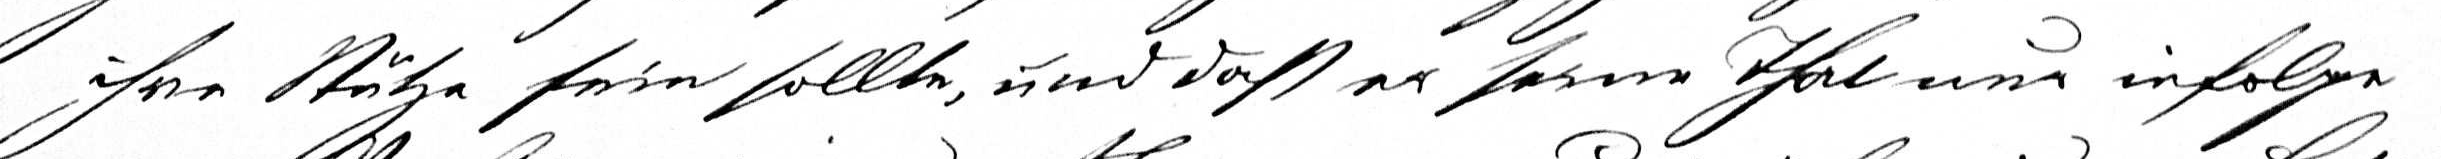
ihre Stütze sein sollte, und daß er seine That nur infolge
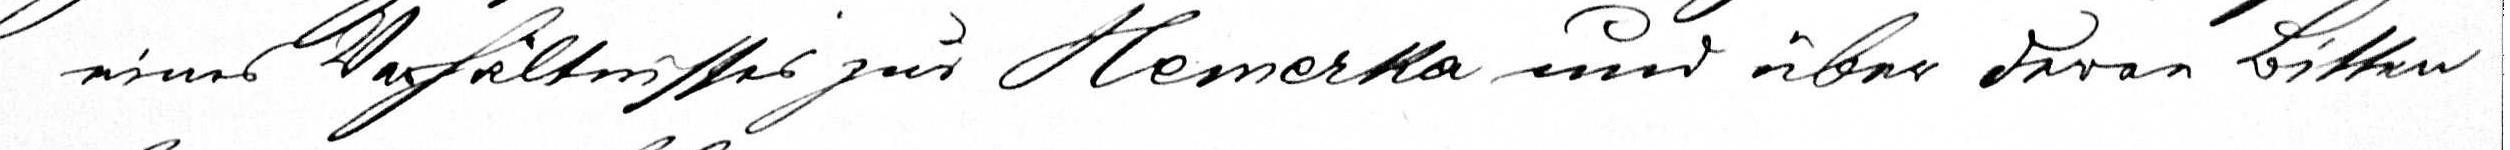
eines Verhältnisses zur Hemerka und über deren Bitten
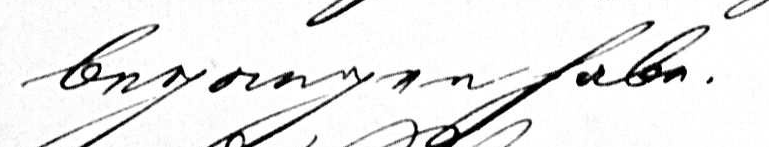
begangen habe.
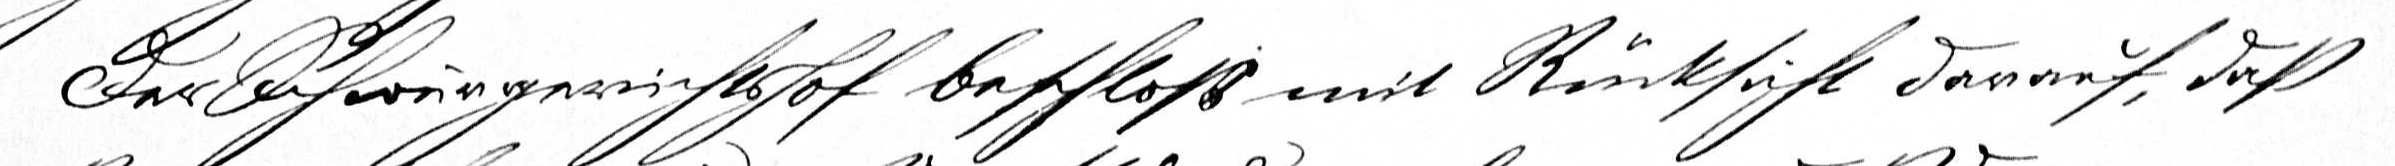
Der Schwurgerichthsof beschloß mit Rücksicht darauf, daß
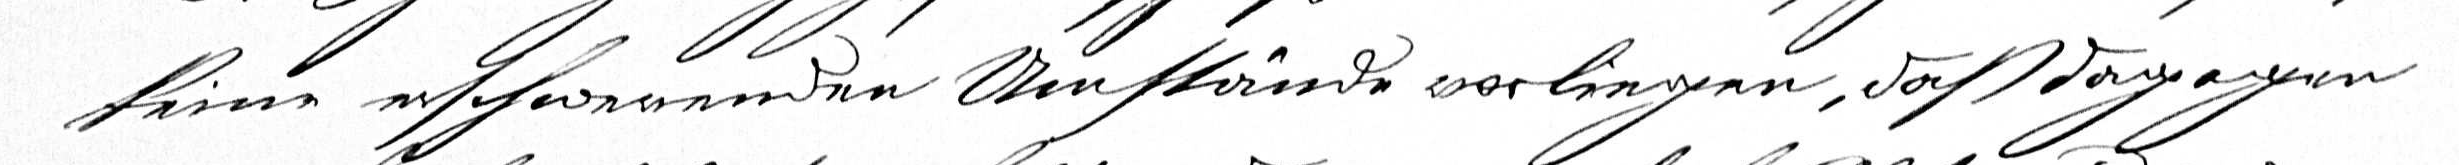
keine erschwerenden Umstände vorliegen, daß dagegen
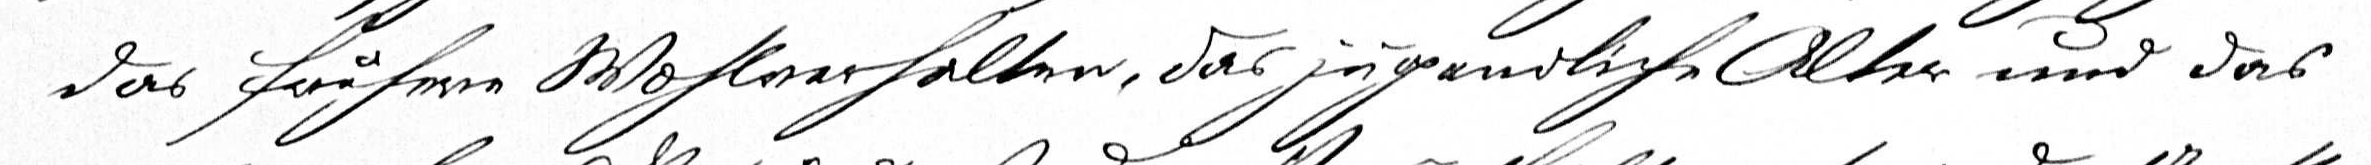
das frühere Wohlverhalten, das jugendliche Alter und das
